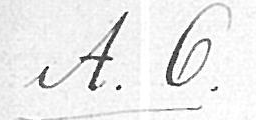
A. 6.
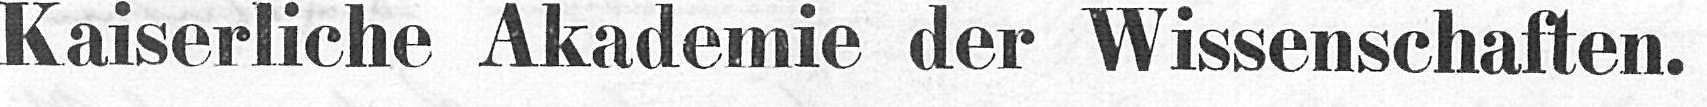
Kaiserliche Akademie der Wissenschaften.
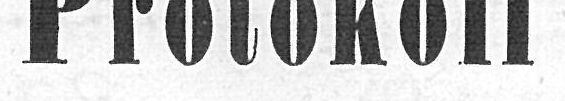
Protokoll
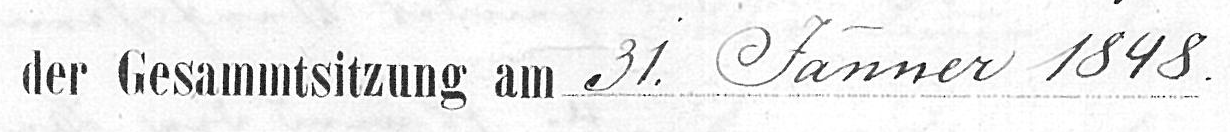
der Gesammtsitzung am 31. Jänner 1848
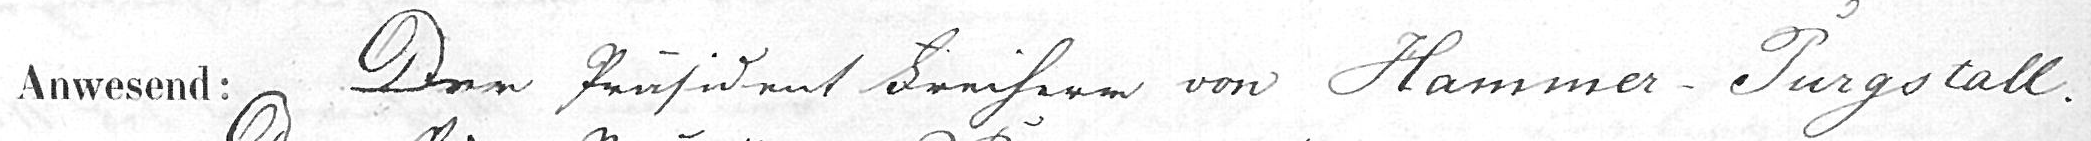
Anwesend: Der Präsident Freiherr von Hammer-Purgstall
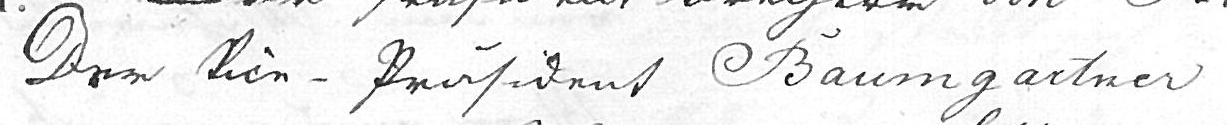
Der Vice-Präsident Baumgartner
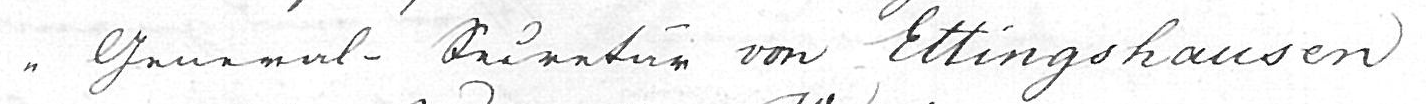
" General-Secretär von Ettingshausen
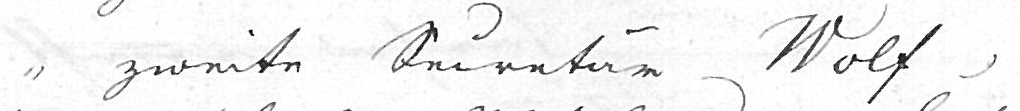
" zweite Secretär Wolf
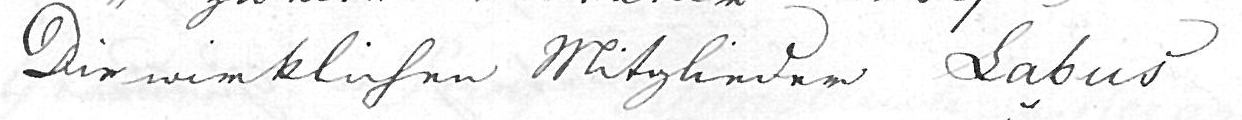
Die wirklichen Mitglieder Labus
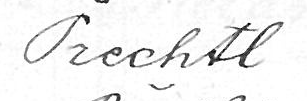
Prechtl
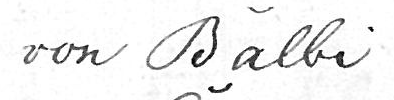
von Balbi
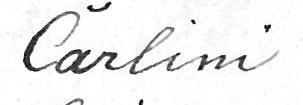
Carlini
